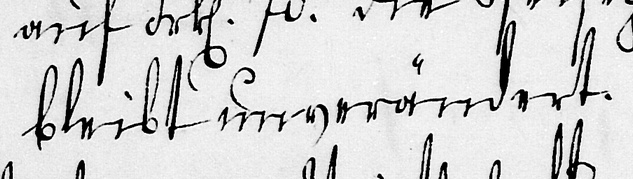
bleibt unverändert.
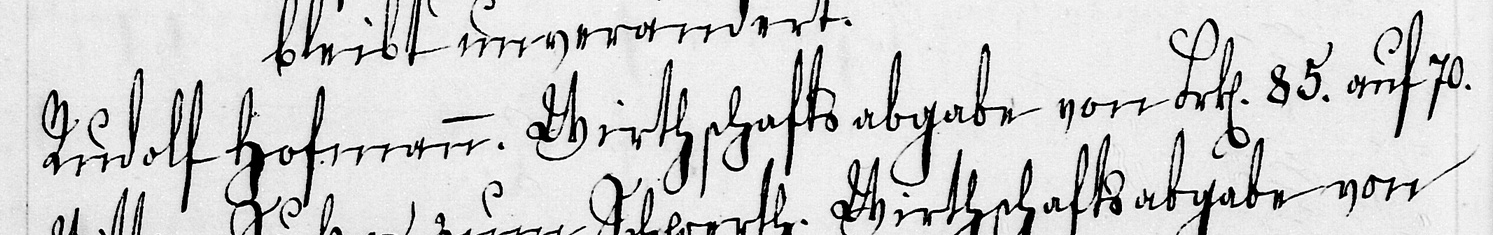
Rudolf Hofmann. Wirthschaftsabgabe von Frk[en]. 85.
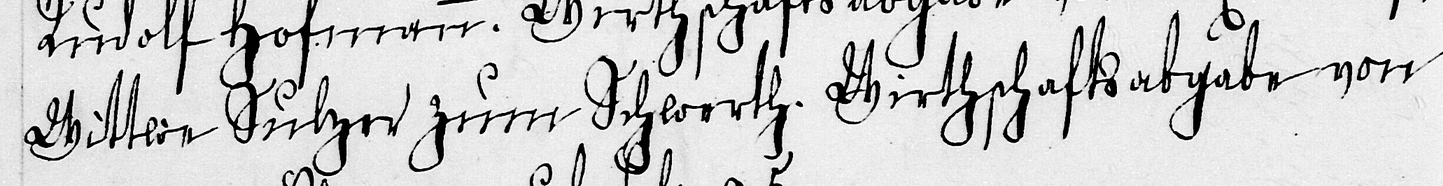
Wittwe Sulzer zum Schwerth. Wirthschaftsabgabe von
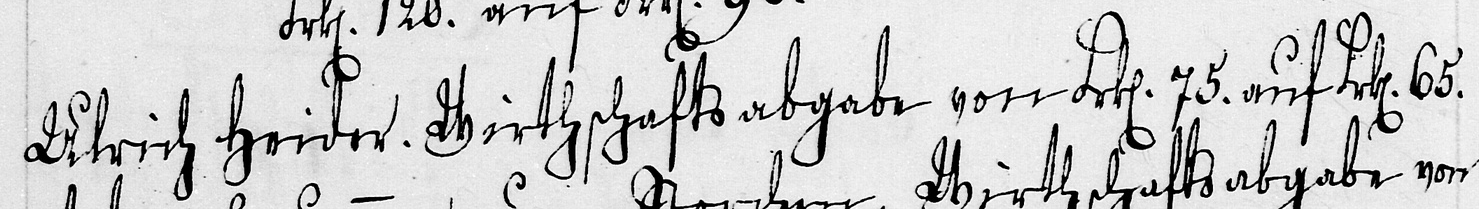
Ulrich Heider. Wirthschaftsabgabe von Frk[en]. 75.
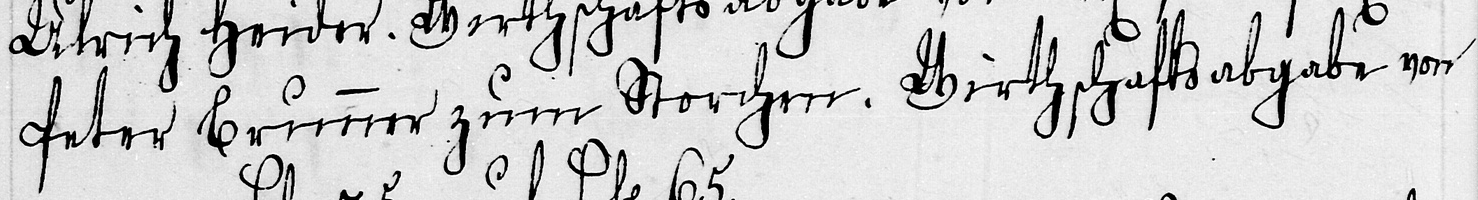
Peter Brunner zum Storchen. Wirthschaftsabgabe von
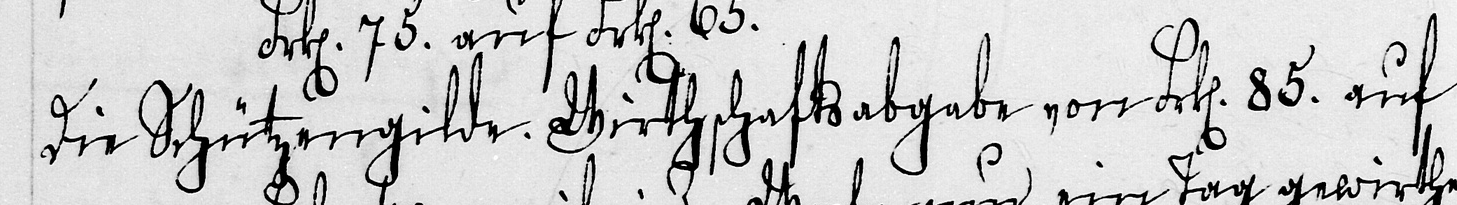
Die Schützengilde. Wirthschaftsabgabe von Frk[en]. 85.
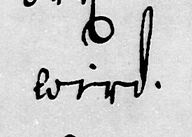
wird.
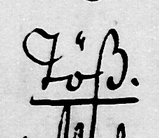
Töß.
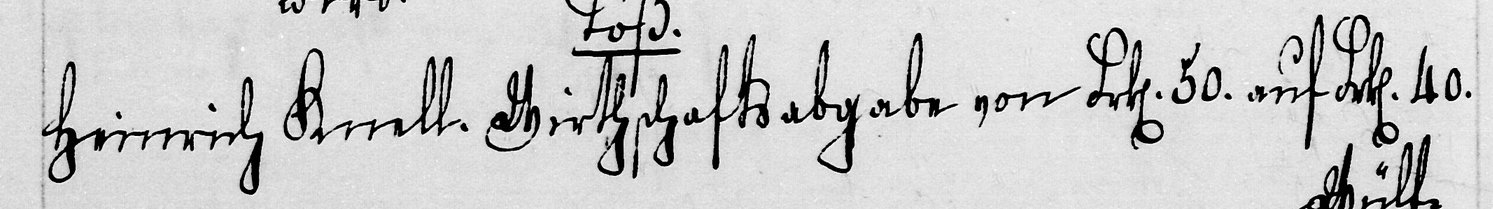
Heinrich Knell. Wirthschaftsabgabe von Frk[en]. 50.
